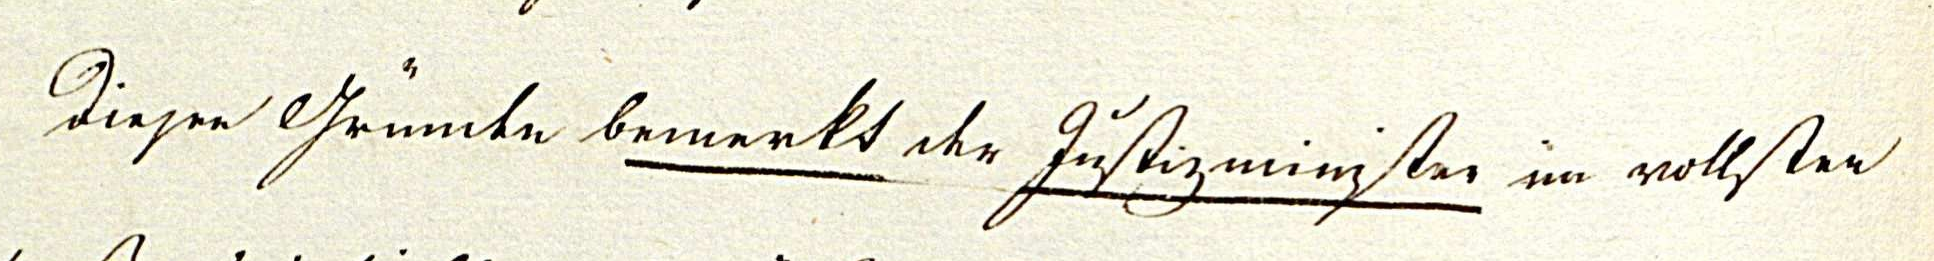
Diesen Gründe bemerkt der Justizminister in vollster
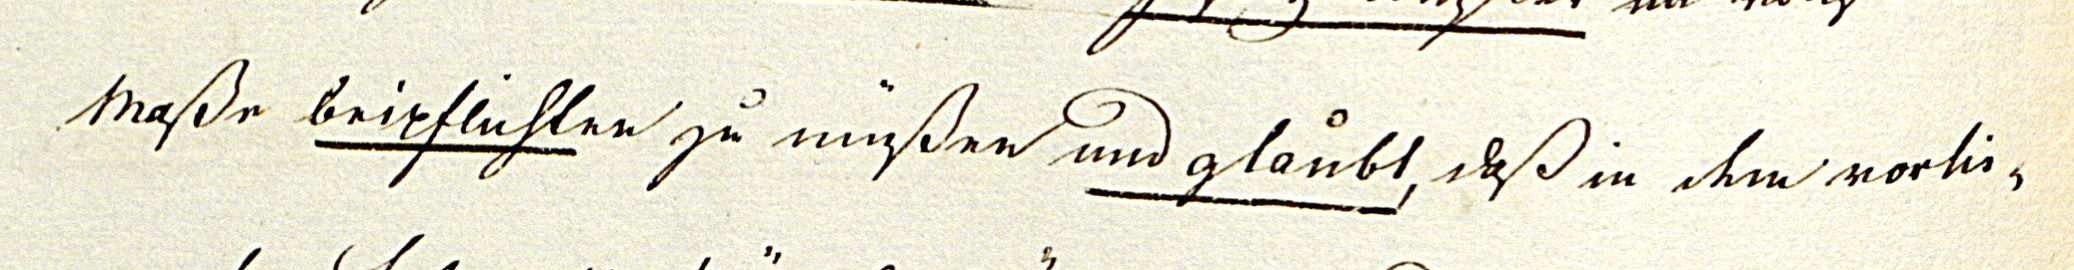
Maße beipflichten zu müßen und glaubt, daß in dem vorlie¬
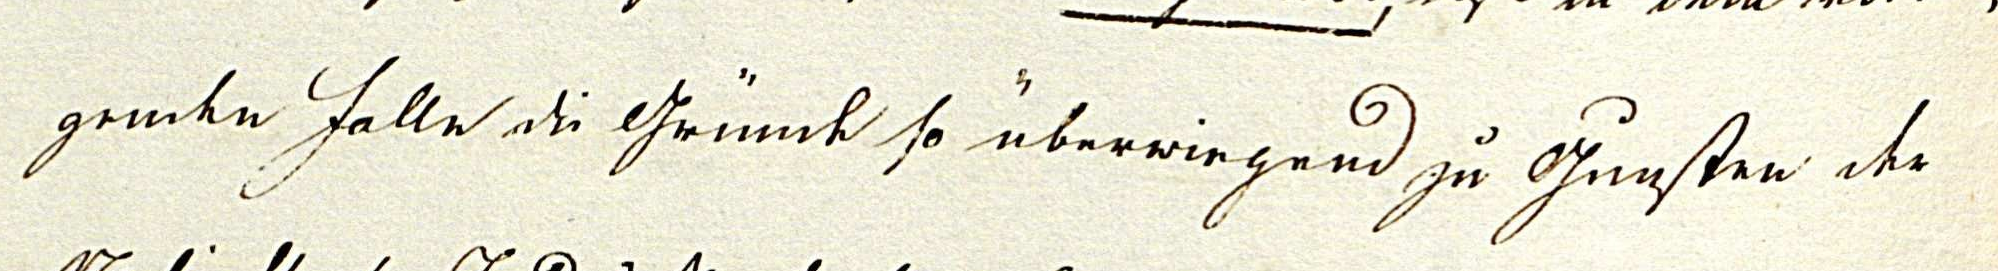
genden Falle die Gründe so überwiegend zu Gunsten der
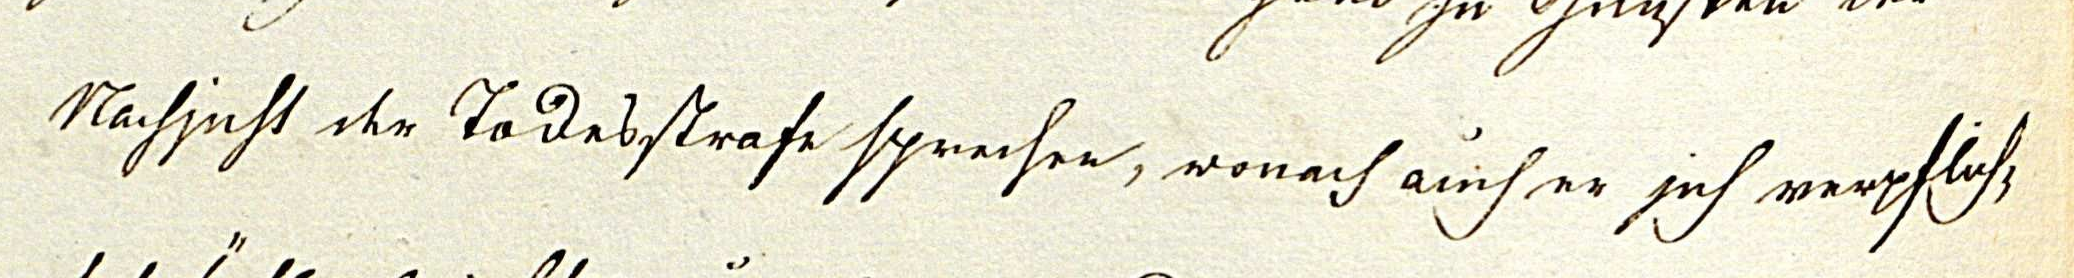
Nachsicht der Todesstrafe sprechen, wonach auch er sich verpflich¬
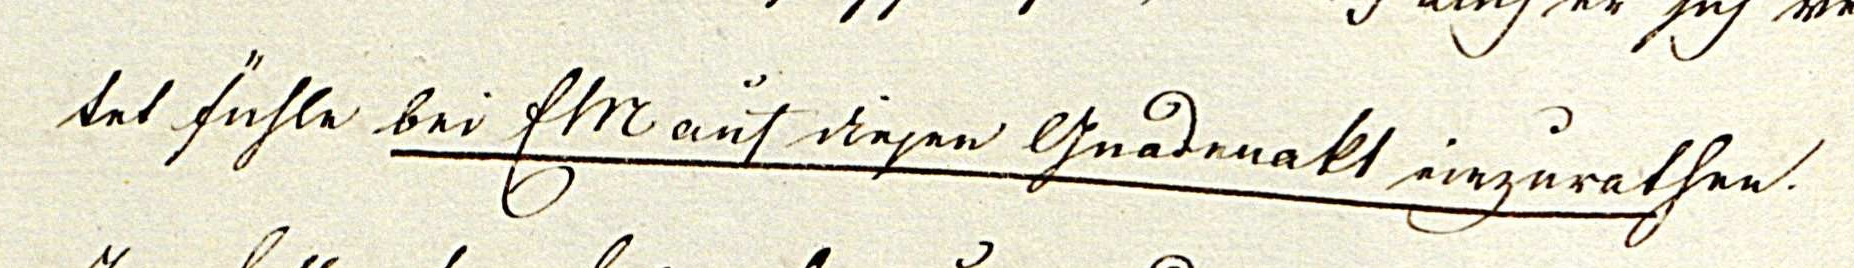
tet fühle bei EM auf diesen Gnadenakt einzurathen.
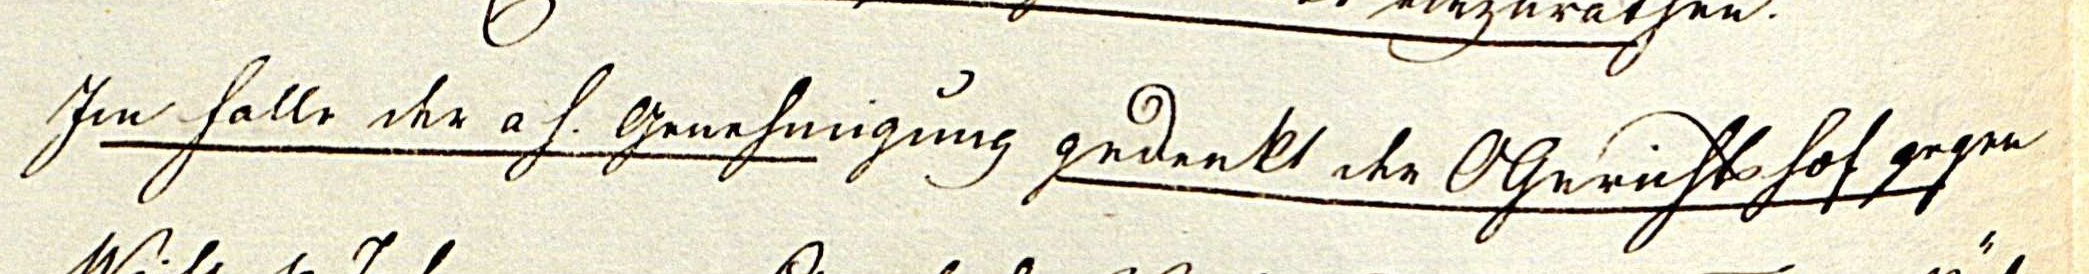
Im Falle der a.h. Genehmigung gedenkt der OGerichtshof gegen
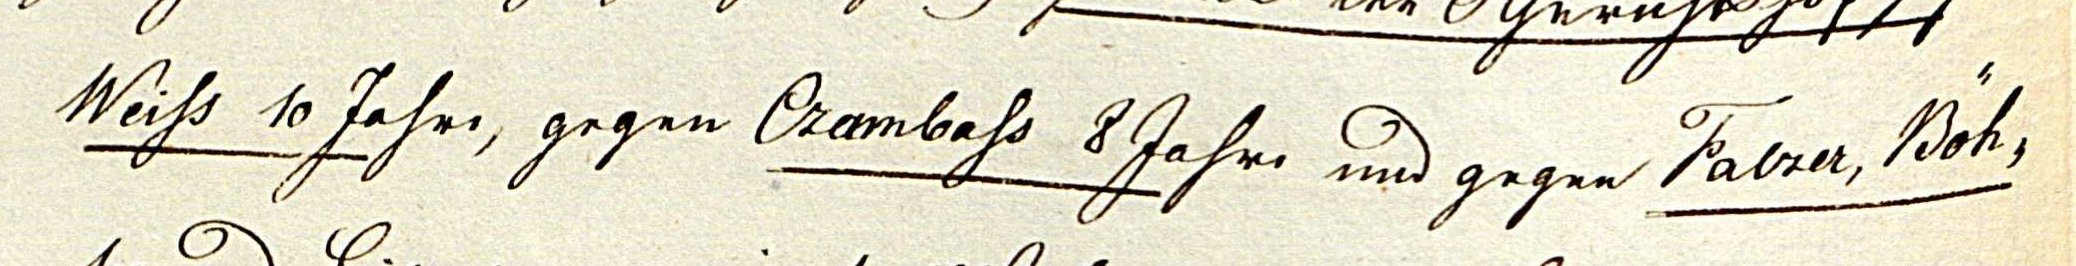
Weiss 10 Jahre, gegen Czambass 8 Jahre und gegen Falzer, Böh¬
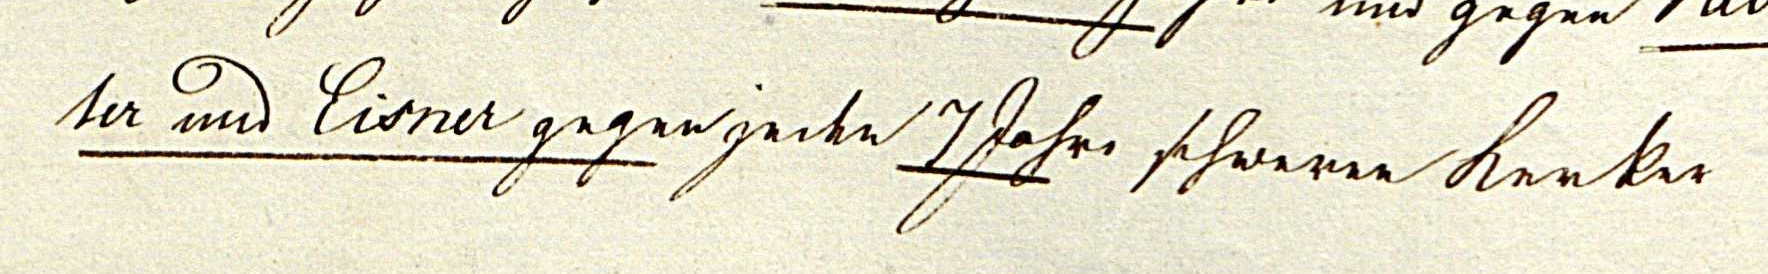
ler und Eisner gegen jeden 7 Jahre schweren Kerker
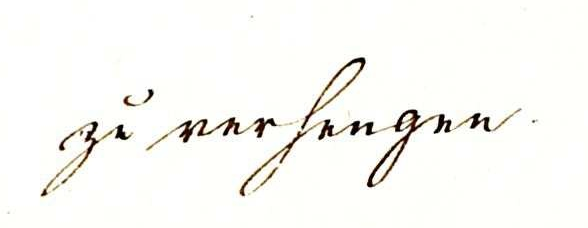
zu verhengen.
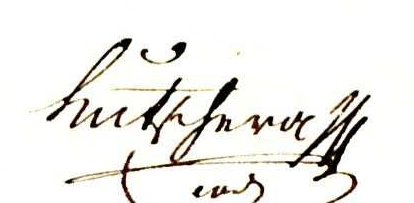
Kutschera
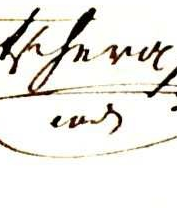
xx
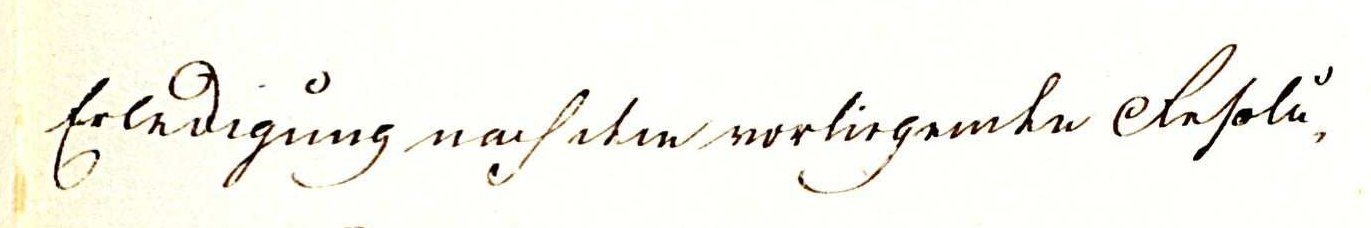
Erledigung nach dem vorliegende Resolu¬
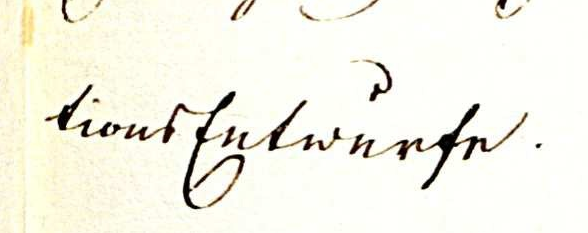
tions Entwurfe.
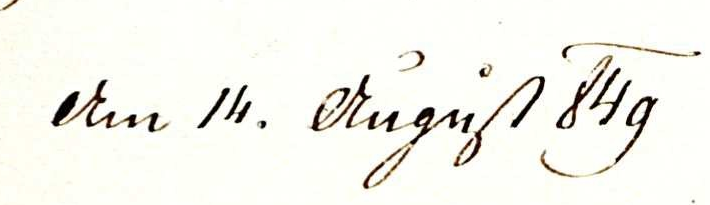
Am 14. August 849
